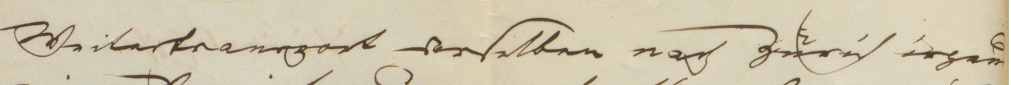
Weitertransport derselben nach Zürich irgend
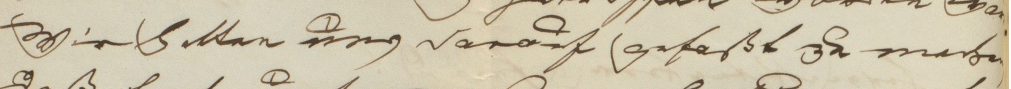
Wir hatten uns darauf gefaßt zu machen,
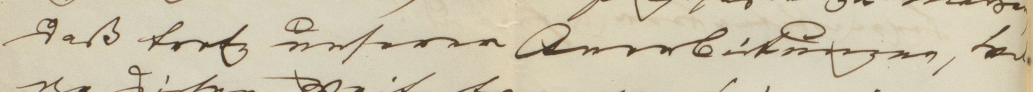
daß trotz unserer Anerbietungen, wel-
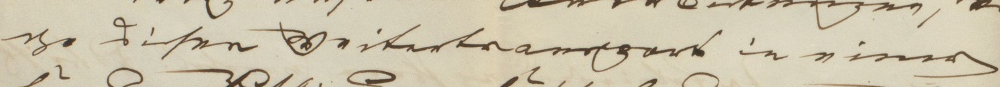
che diesen Weitertransport in einer
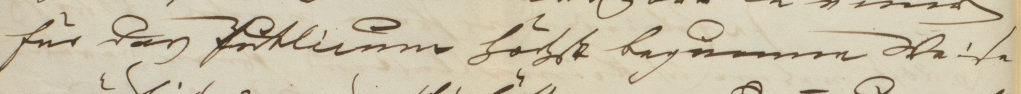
für das Publicum höchst bequemen Weise
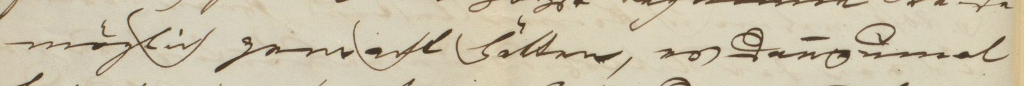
möglich gemacht hätten, es dannzumal
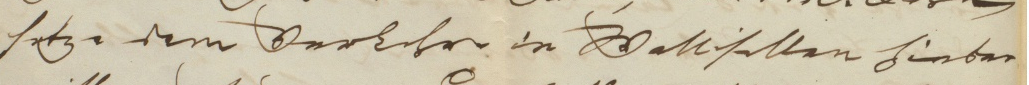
setze dem Verkehr in Wallisellen Hinder-
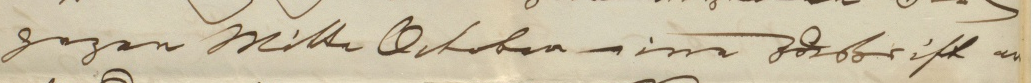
gegen Mitte October eine Zuschrift an
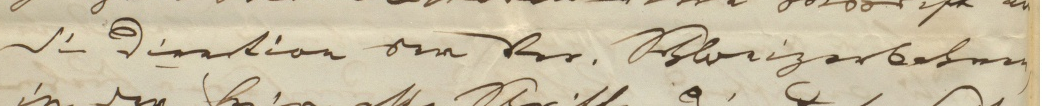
die Direction der Ver. Schweizerbahnen,
